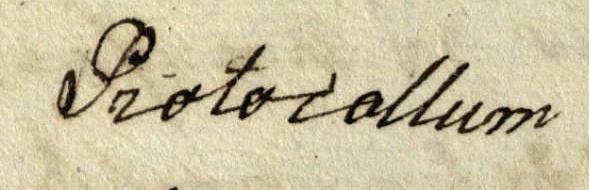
Protocollum
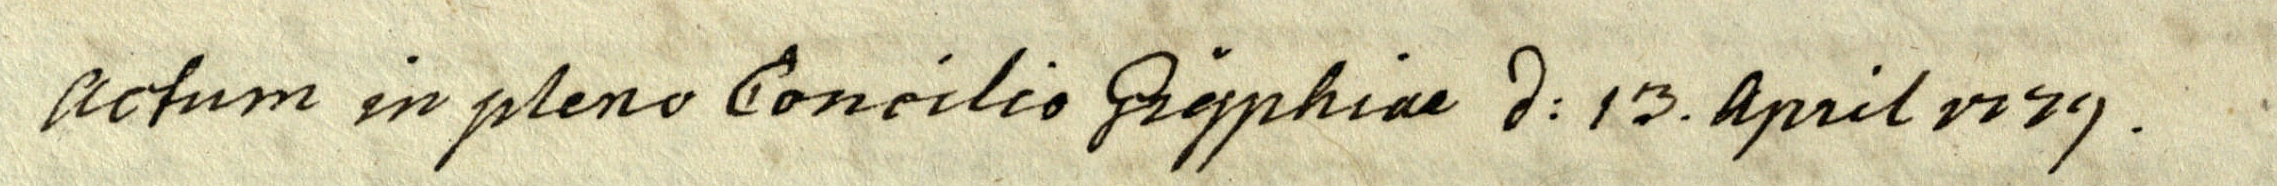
Actum in pleno Concilio Grÿphiae d. 13. April 1779.
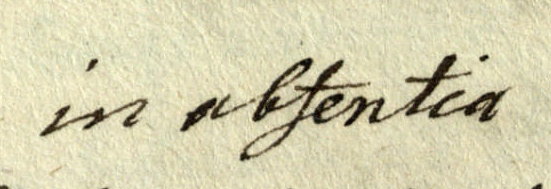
in absentia
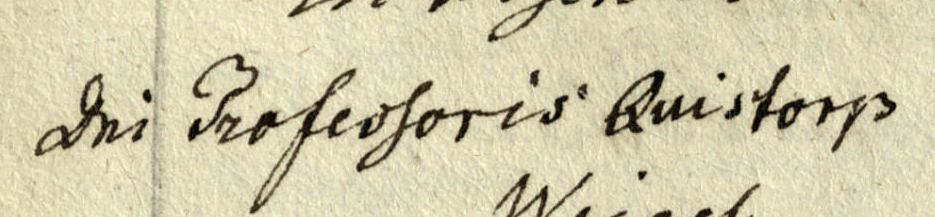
Dni Professoris Quistorp
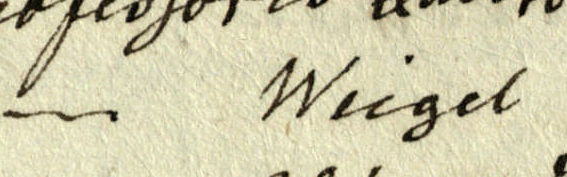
Weigel
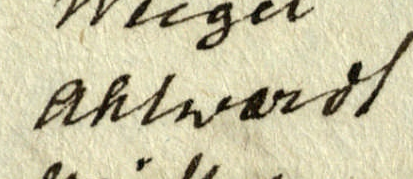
Ahlwardt
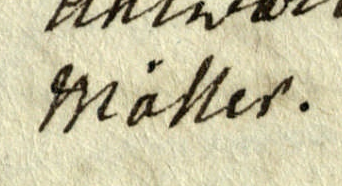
Möller.
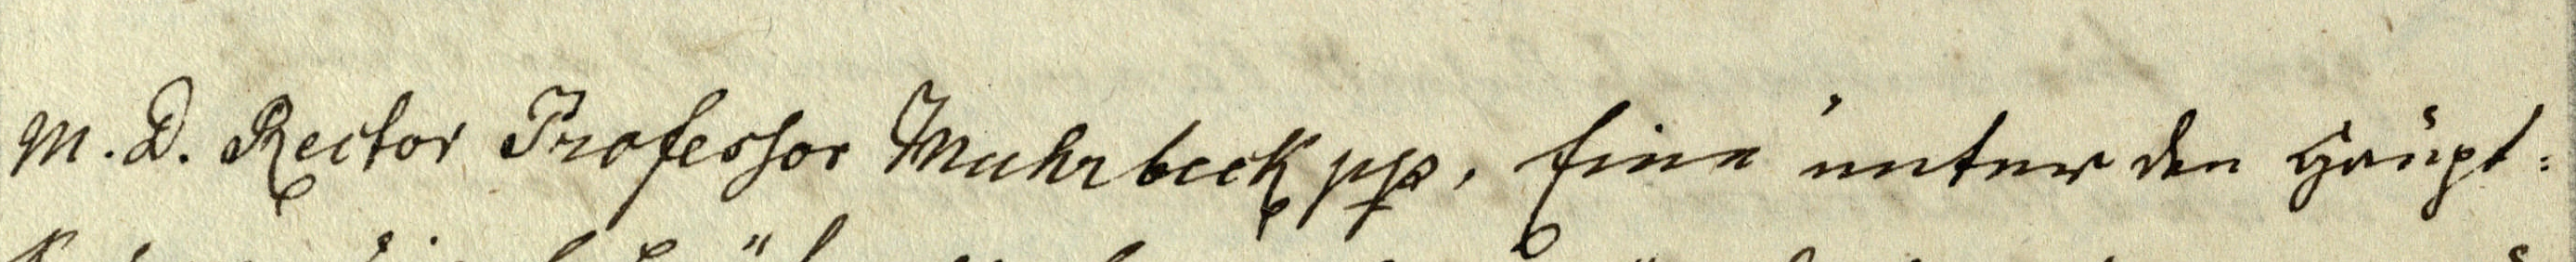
M. D. Rector Professor Muhrbeck pp. Eine unter den Haupt¬
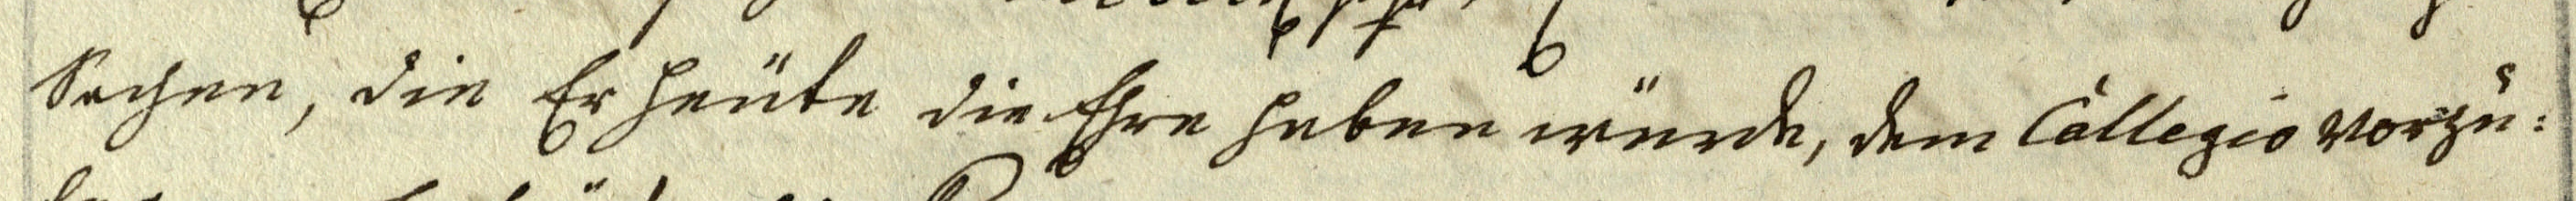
Sachen, die Er heute die Ehre haben würde, dem Collegio vorzu¬
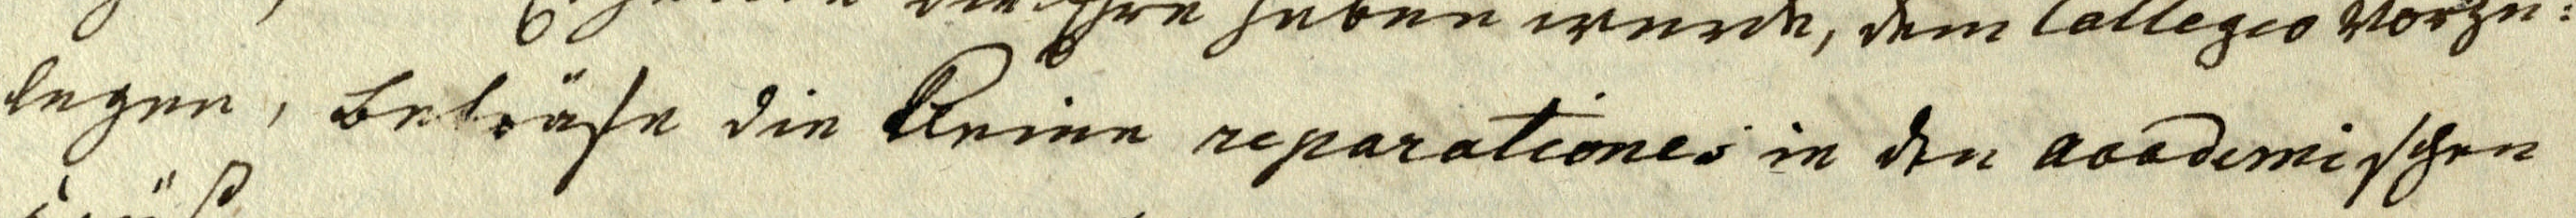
legen, beträfe die kleine reparationes in den academischen
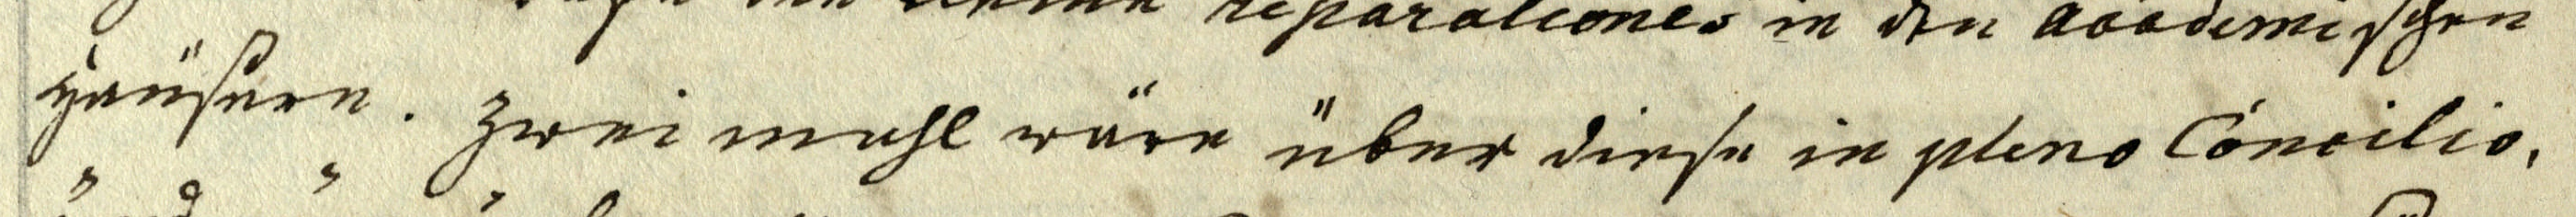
Häusern. Zwei mahl wäre über diese in pleno Concilio,
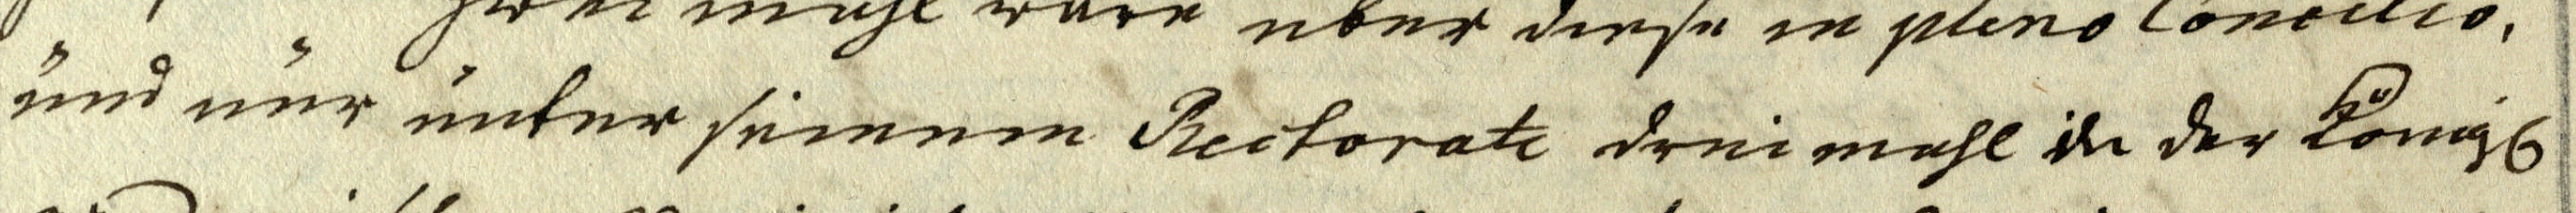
und nur unter seinem Rectorate dreimahl in der Königl.
